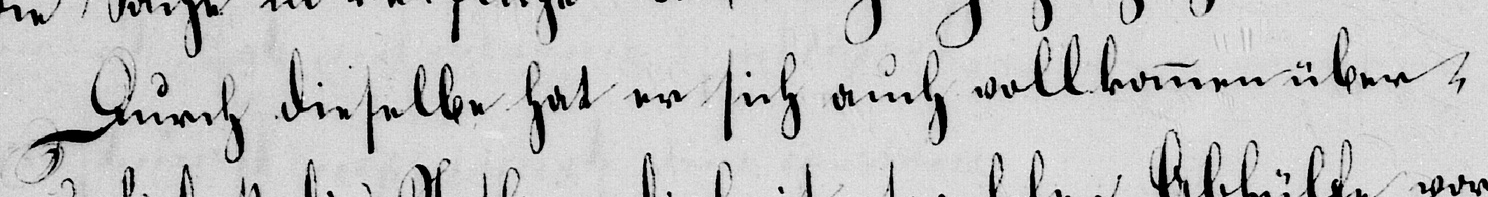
Durch dieselbe hat er sich auch vollkommen über¬
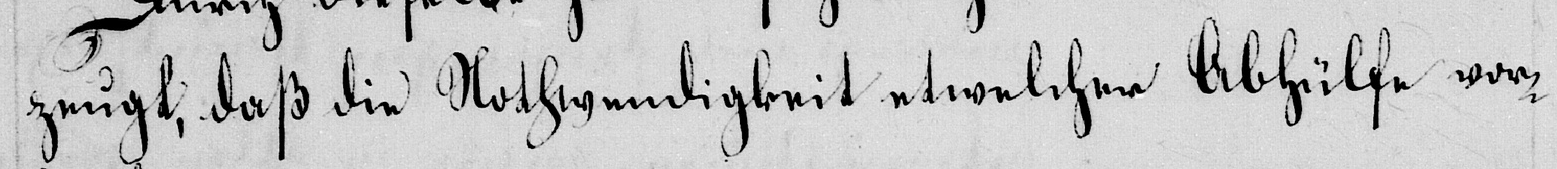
zeugt, daß die Nothwendigkeit etwelcher Abhülfe vor¬
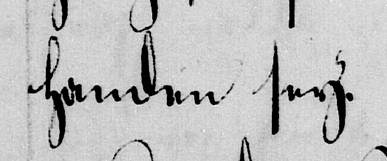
handen sey.
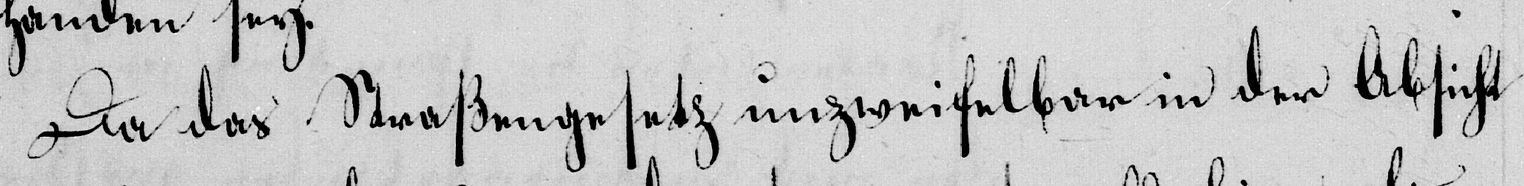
Da das Straßengesetz unzweifelbar in der Absicht
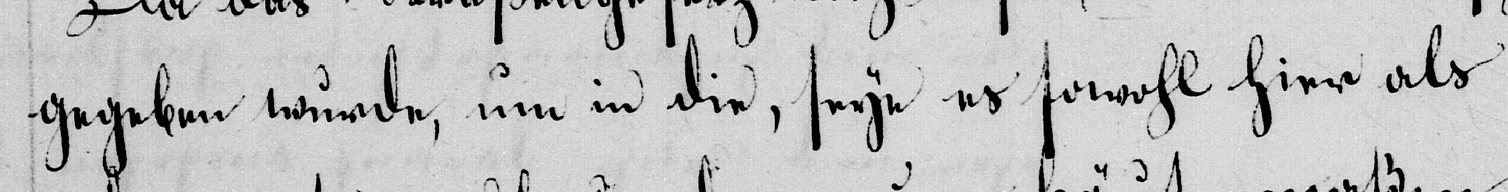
gegeben wurde, um in die, seye es sowohl hier als
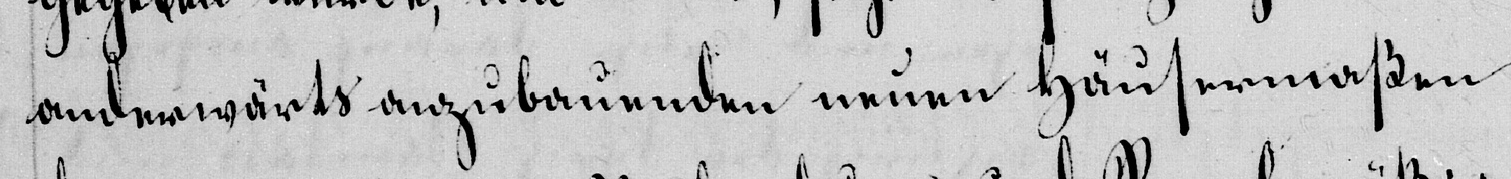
anderwärts anzubauenden neuen Häusermaßen
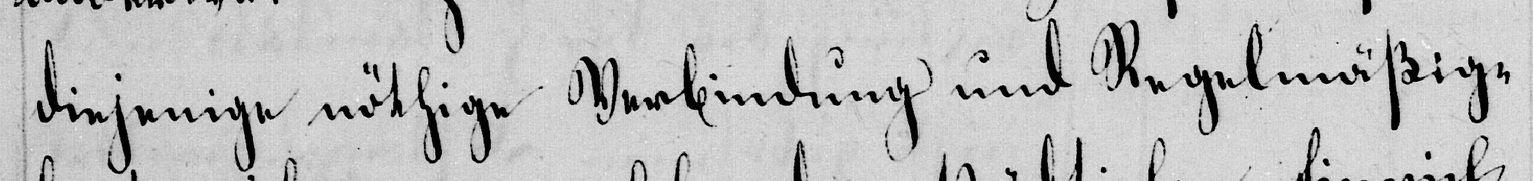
diejenige nöthige Verbindung und Regelmäßig¬
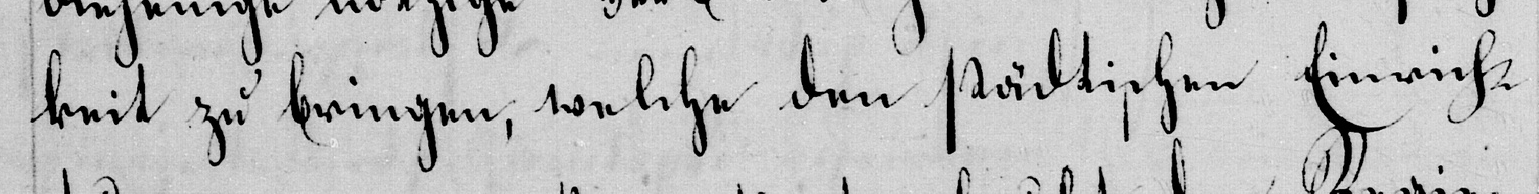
keit zu bringen, welche den städtischen Einrich¬
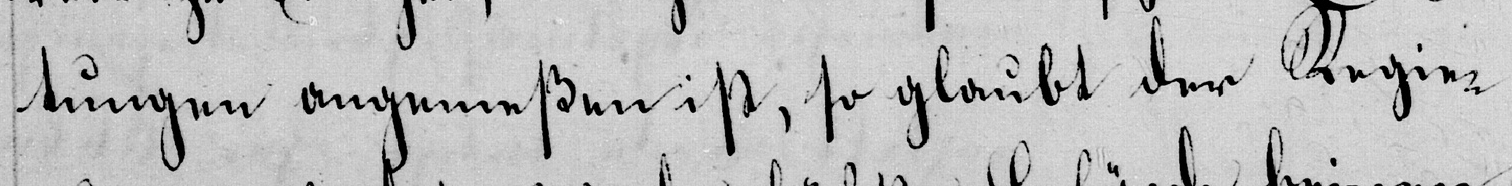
tungen angemeßen ist, so glaubt der Regie¬
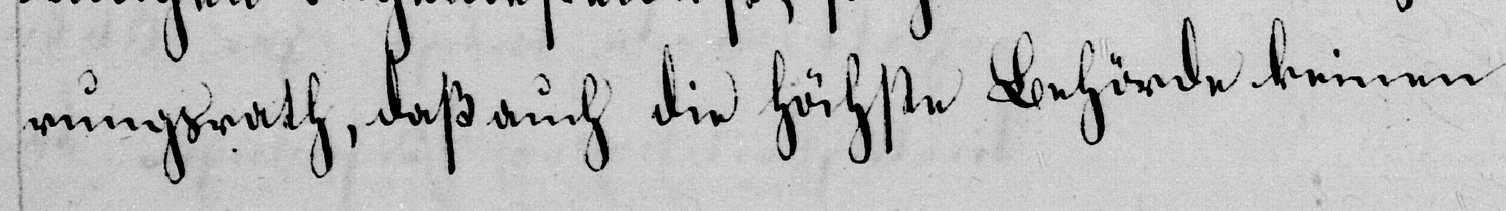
rungsrath, daß auch die Höchste Behörde keinen
